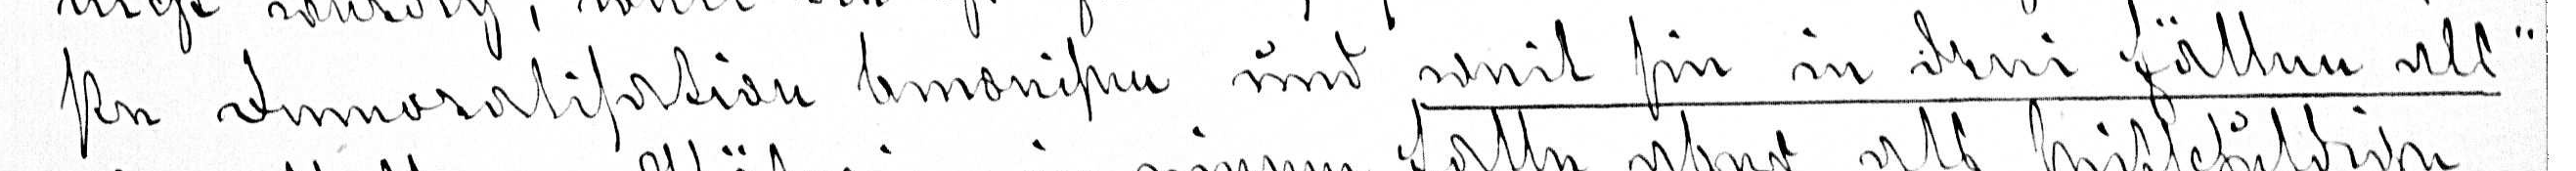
ten Demoralisation beweisen und weil sie in drei Fällen als
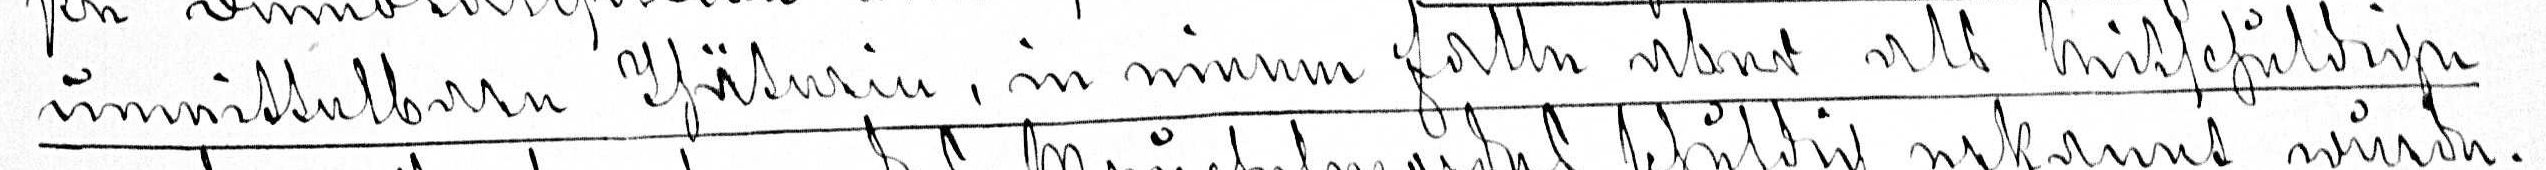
unmittelbare Thäterin, in einem Falle aber als Mitschuldige
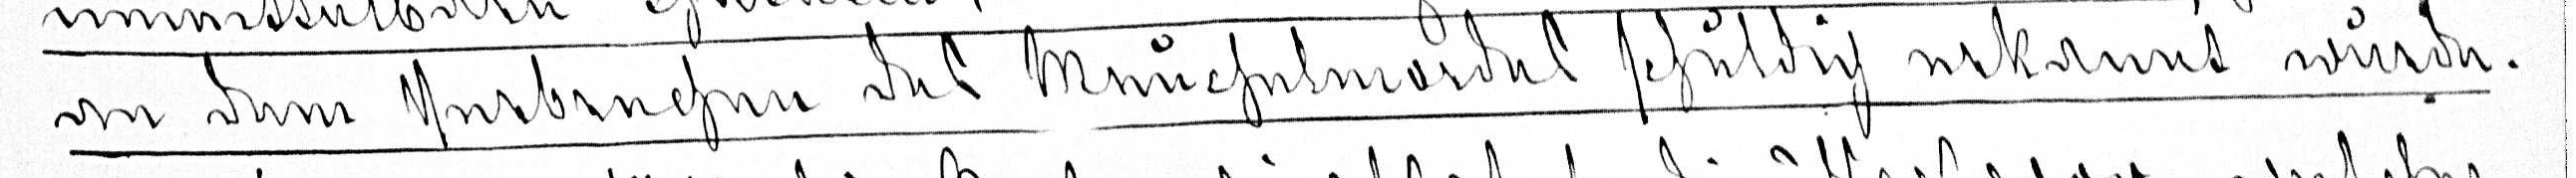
an dem Verbrechen des Meuchelmordes schuldig erkannt wurde.
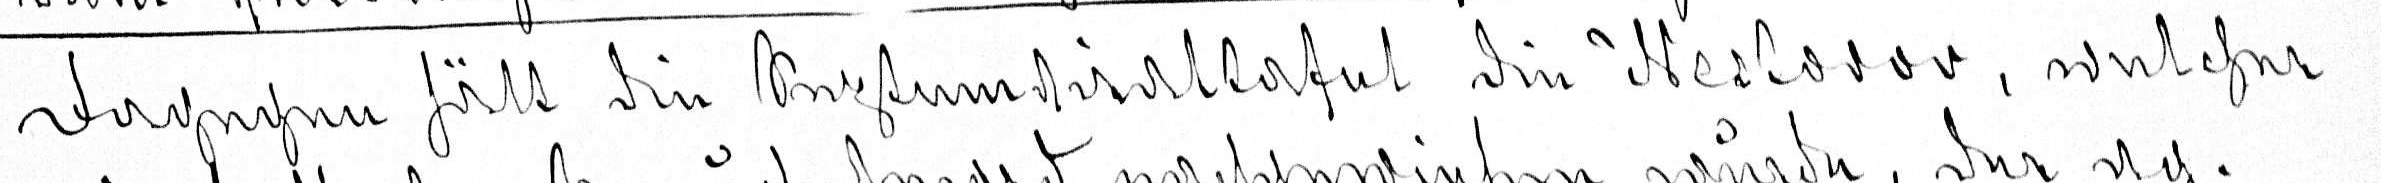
Dagegen hält die Septemvirattafel die Nestorov, welcher
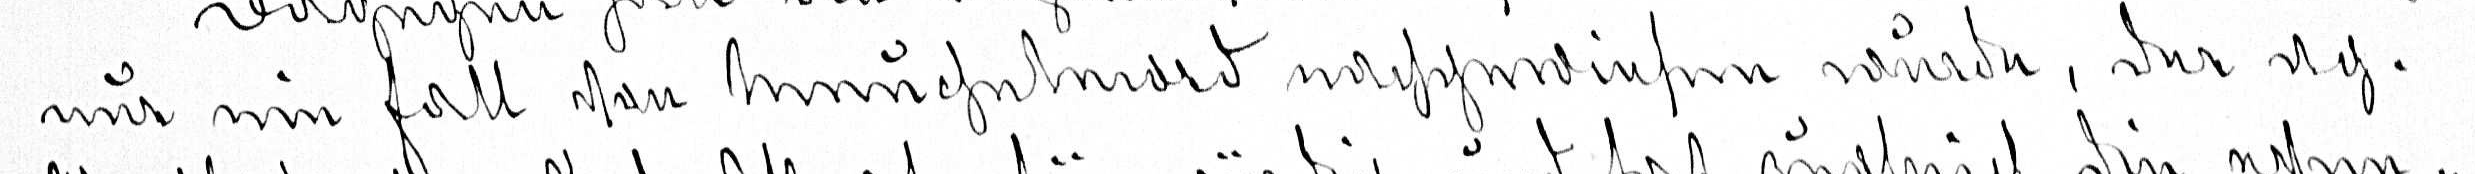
nur ein Fall von Meuchelmord nachgewiesen wurde, der ag.
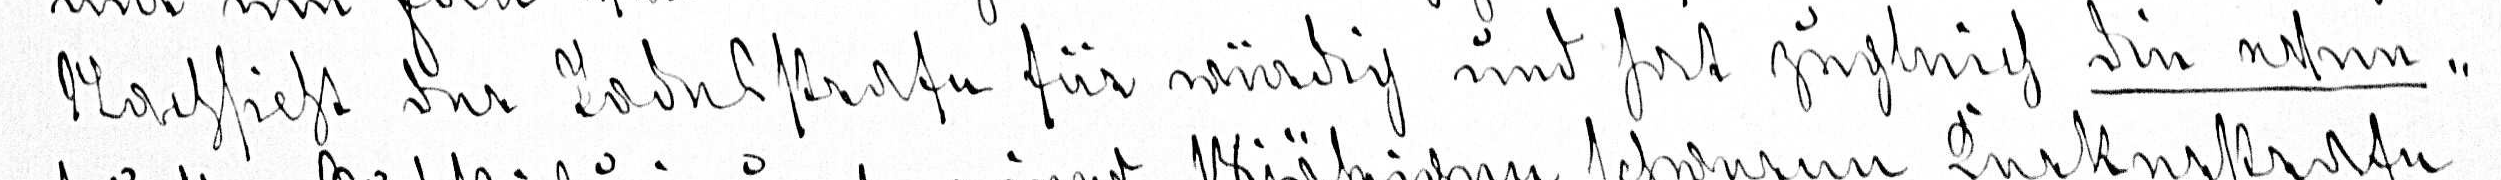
Nachsicht der Todesstrafe für würdig und hat zubleich die even¬
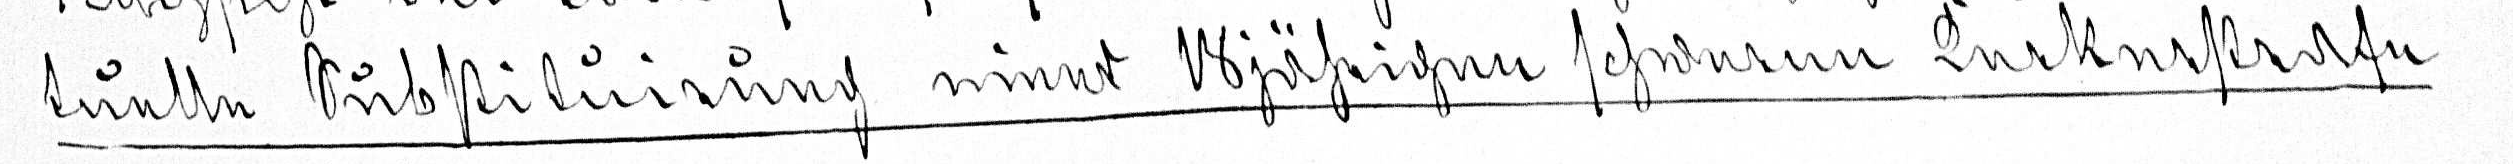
tuelle Substituirung einer 18jährigen schweren Kerkerstrafe
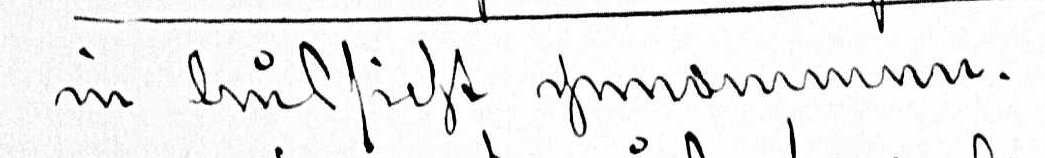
in Aussicht genommen.
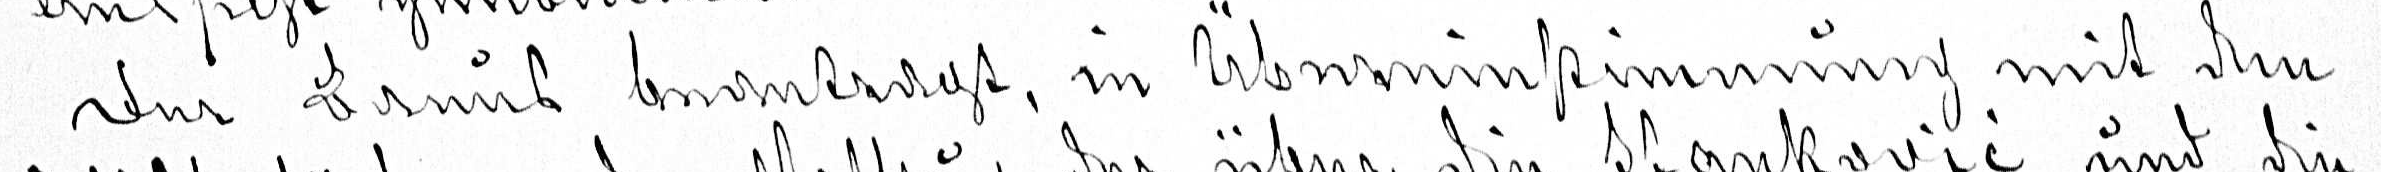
Der Banus beantragt, in Übereinstimmung mit den
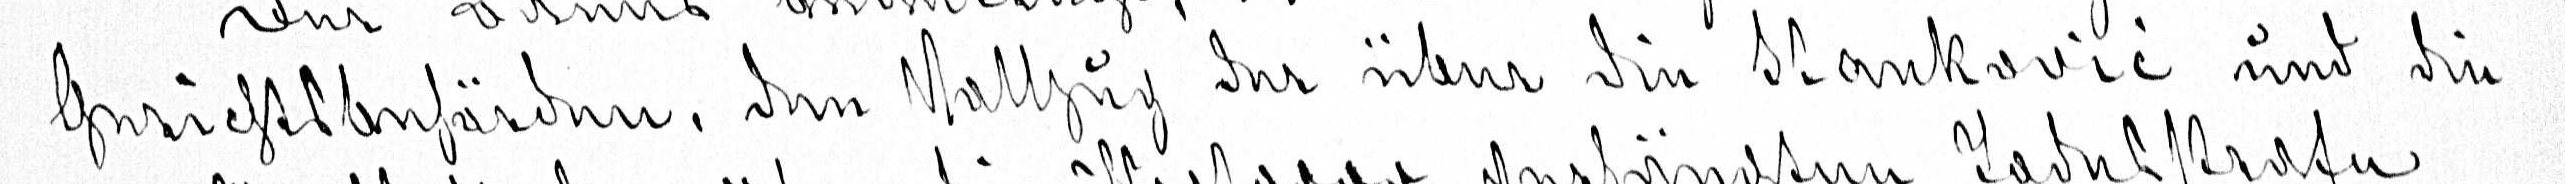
Gerichtsbehörden, den Vollzug der über die Skanković und die
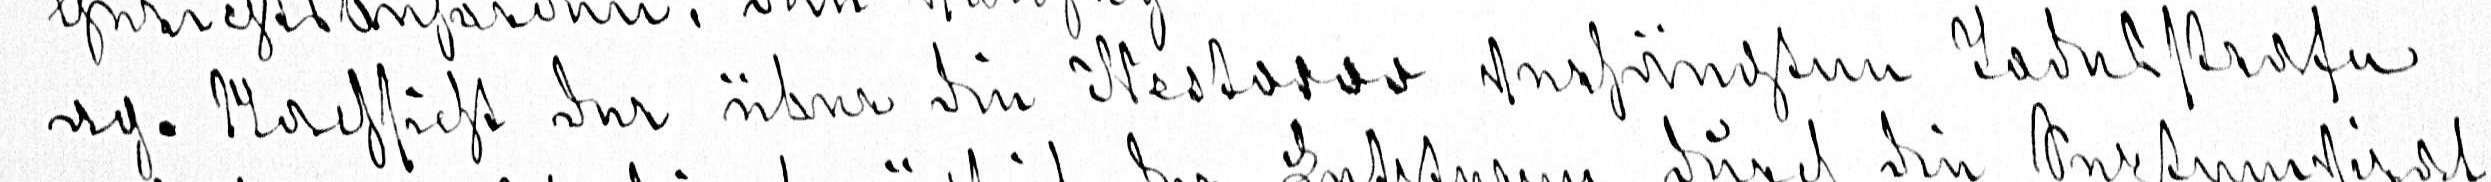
ag. Nachsicht der über die Nestorov verhängten Todesstrafe
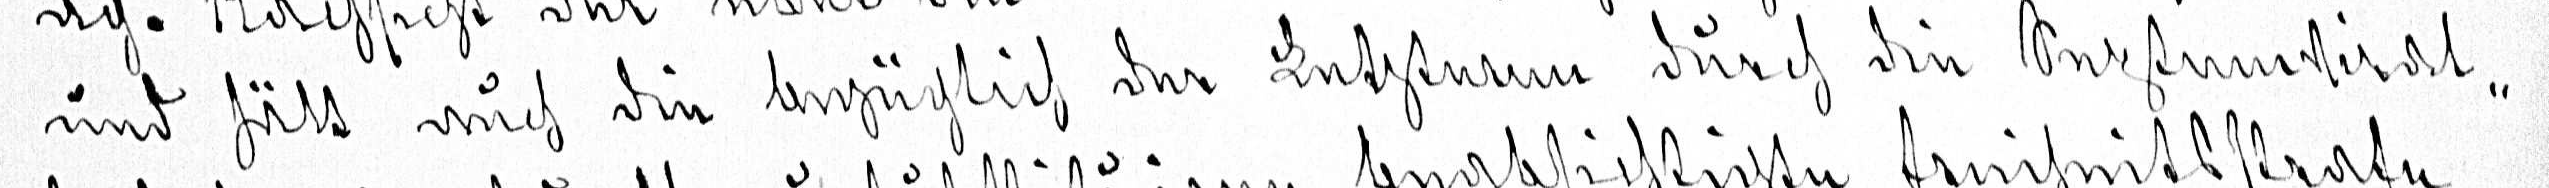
und hält auch die bezüglich der Letzteren durch die Septemviral¬
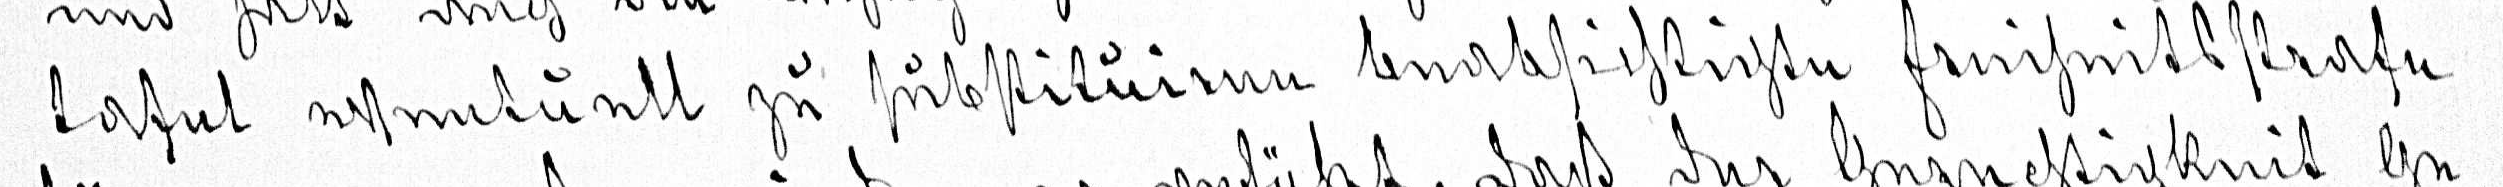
tafel eventuell zu substituiren beabsichtigte Freiheitsstrafe
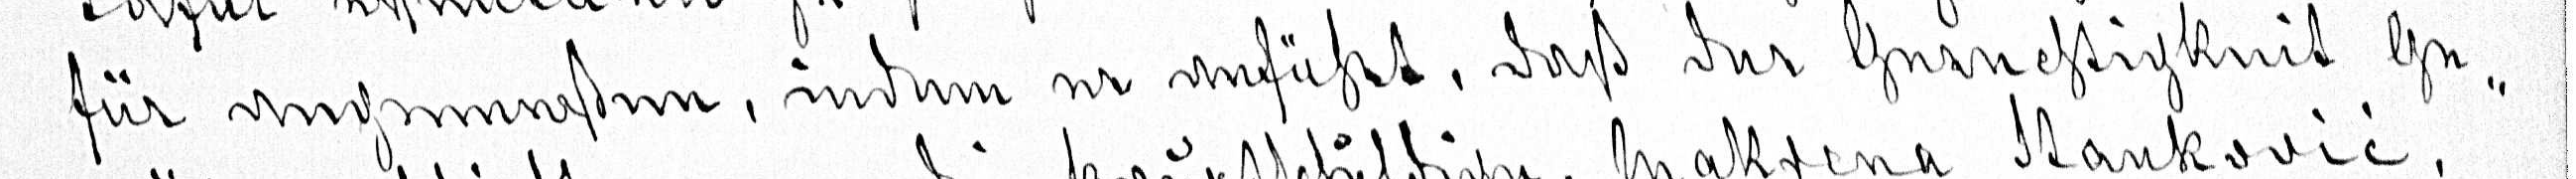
für angemeßen, indem er anführt, daß der Gerechtigkeit Ge¬
